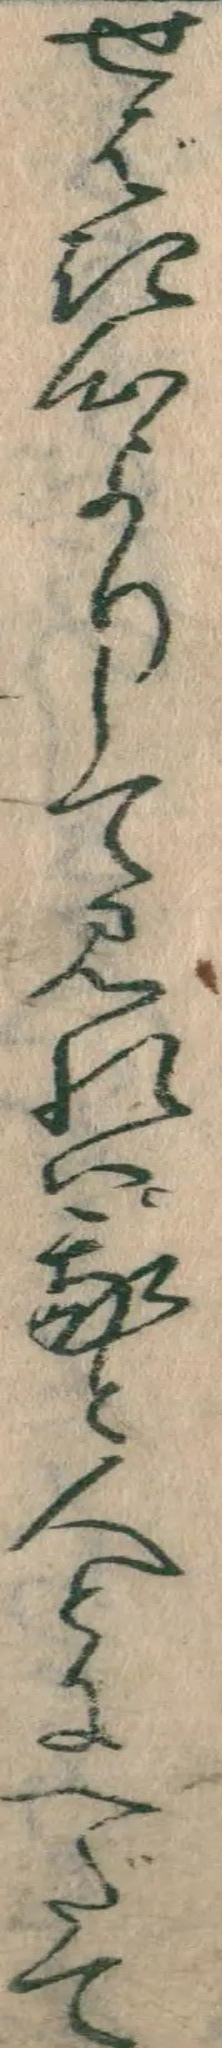せばき心よりして見れは。我と人とにへだて
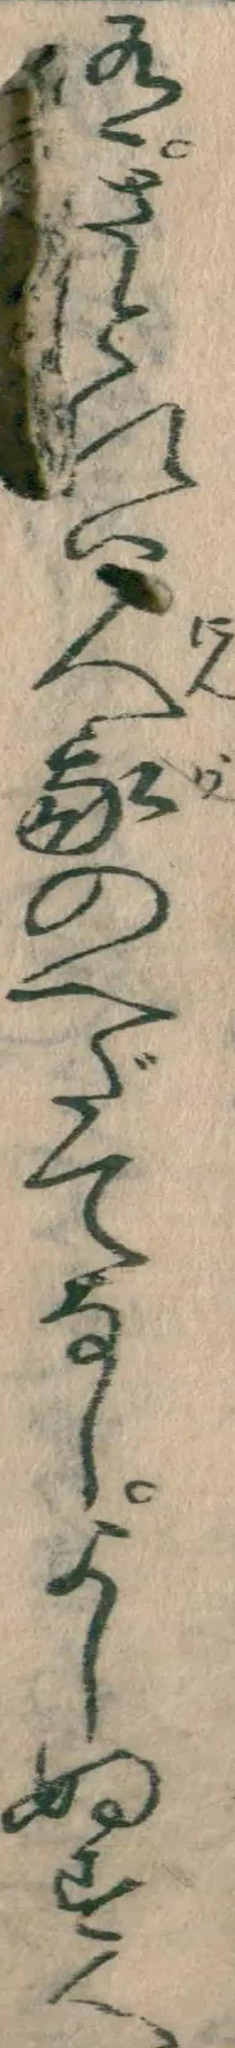有。さとれは人家へだてなし。よしぬす人
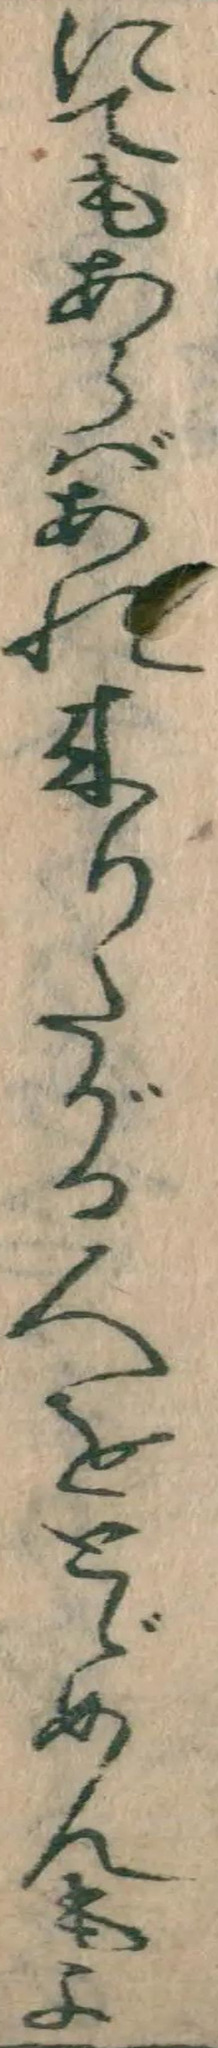にてもあらばあれ来りたがる人をとゞめんもよ

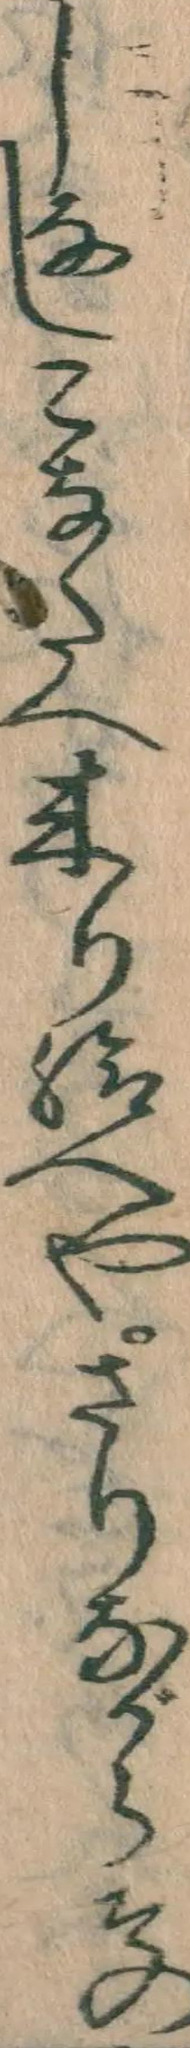しなしこなたへ来り給へや。さりながらその
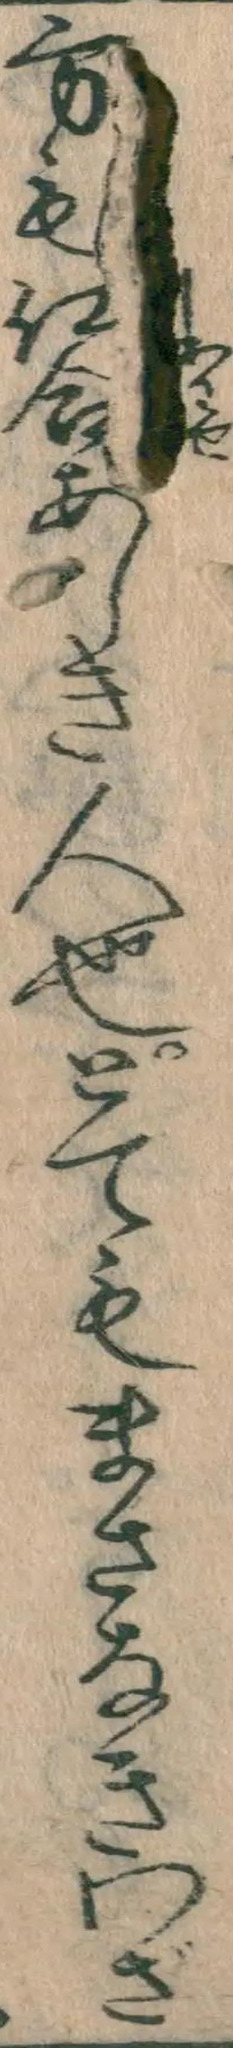方も仕合あしき人成。とてもまさなきわざ
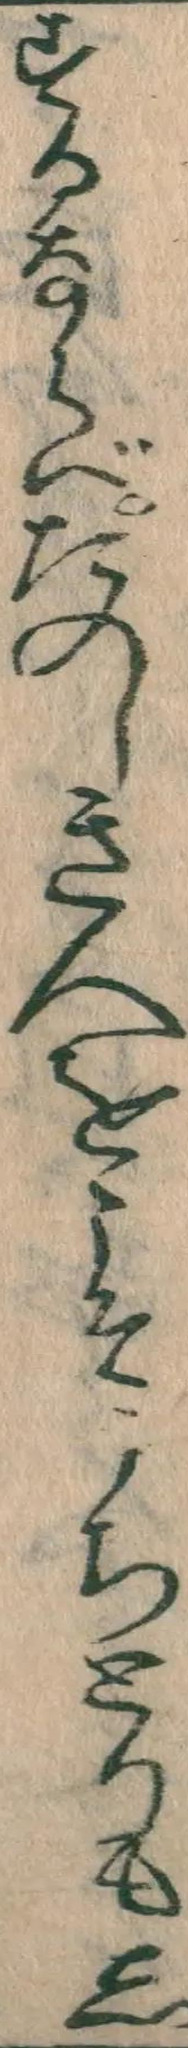するならば。たのしき人をこそちとりもし
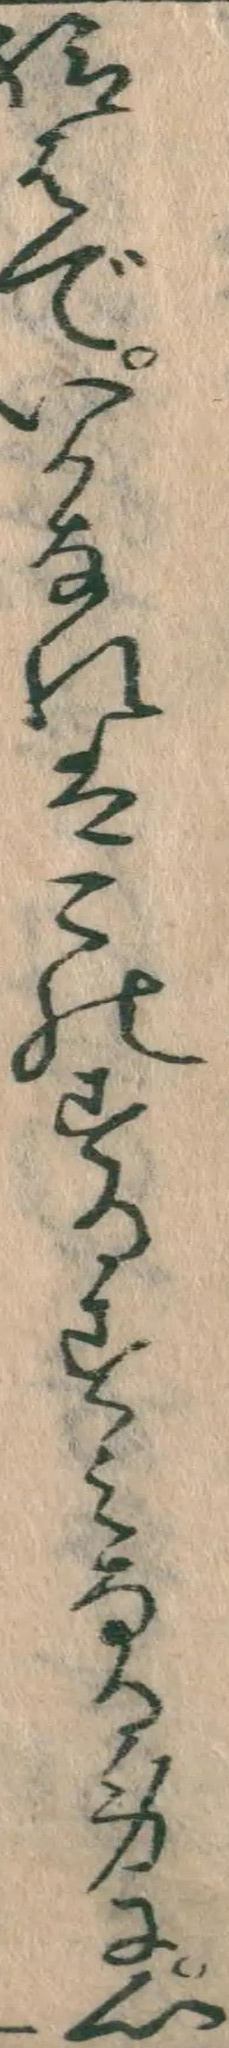給はで。いかなれはこのするすみなる身に。心
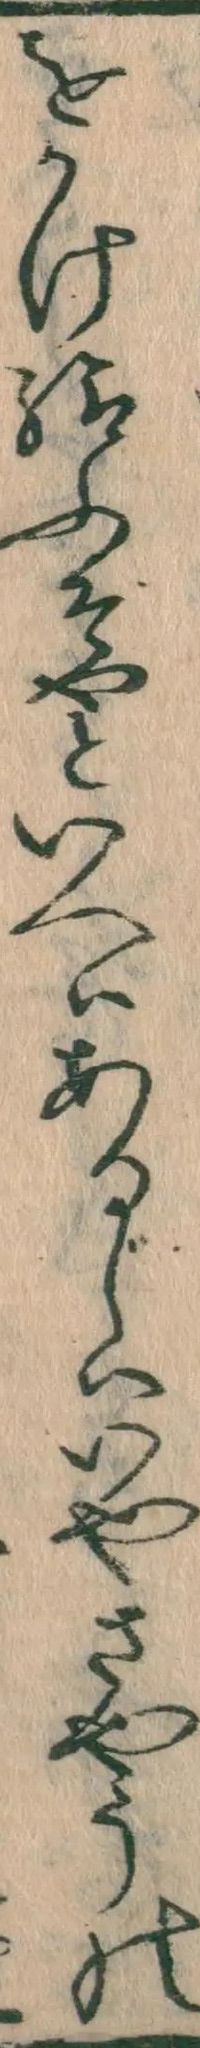をかけ給ふそやといへはあるじはいやさやうの
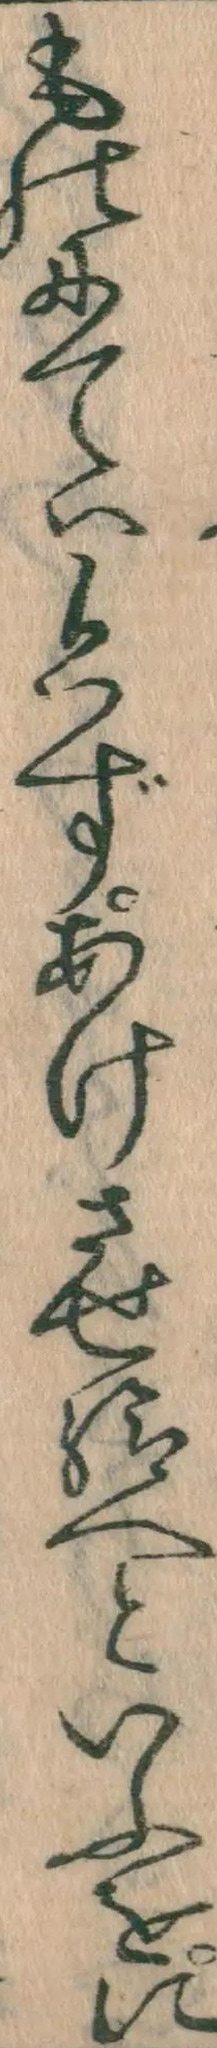ものにては候はず。あけさせ給へといふを。に
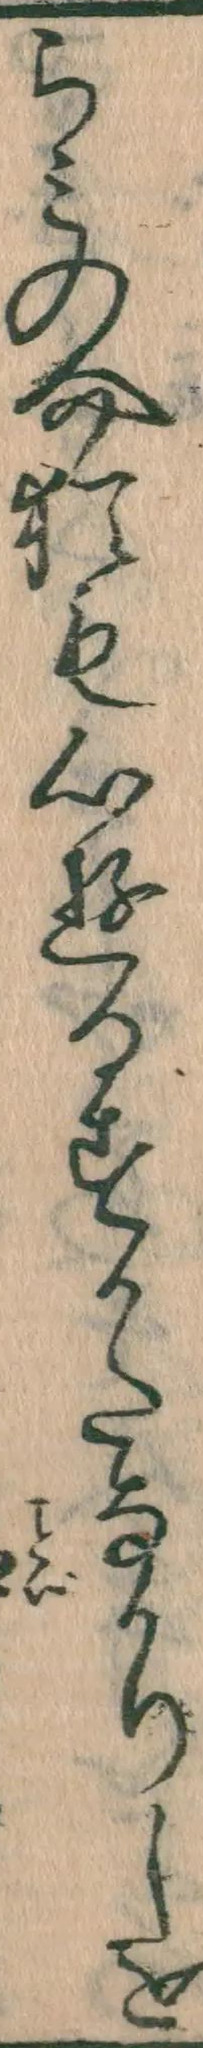らみの介猶も心ゆかすかたなかりしを
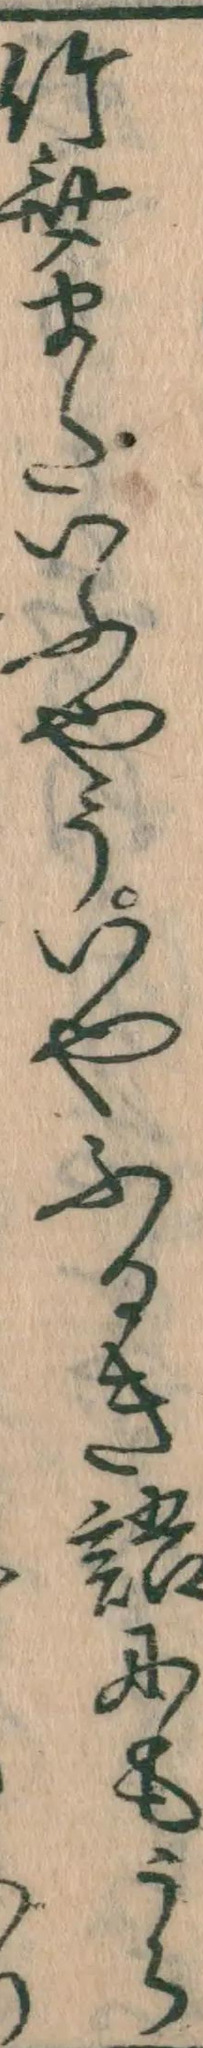竹斎またいふやう。いやふるき語にもうら
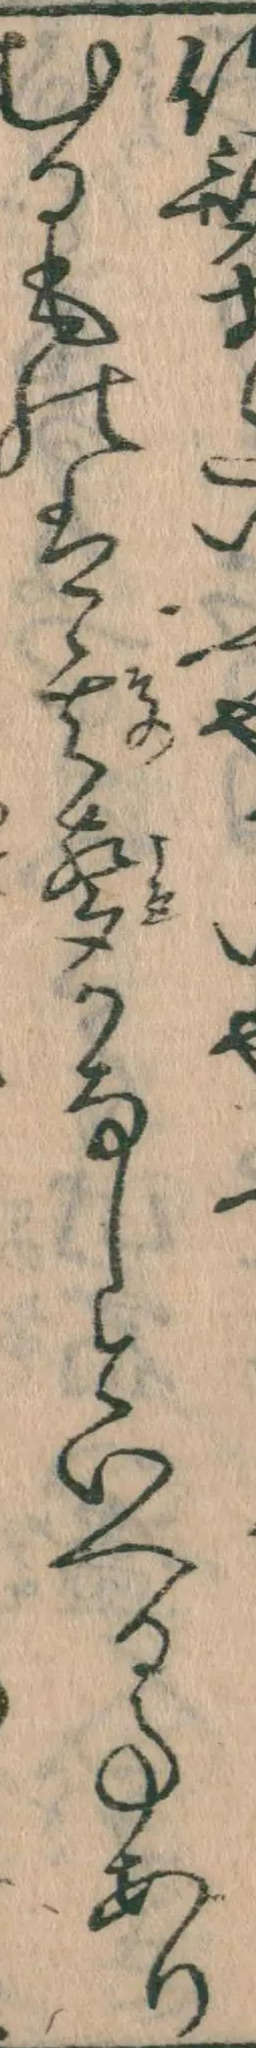むるものは其声かなしといへる事あり
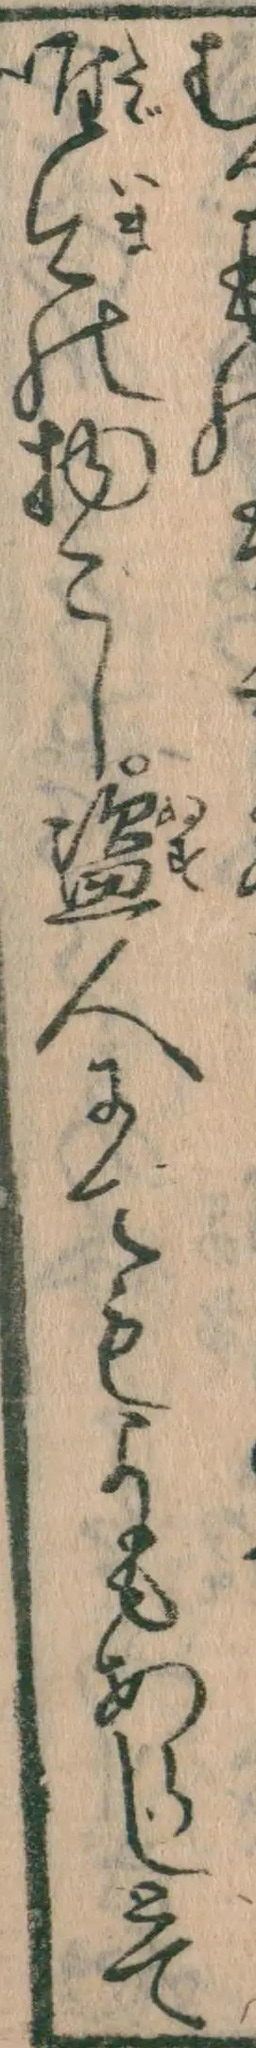唯今の物こし。盗人にてもよもあらしとて
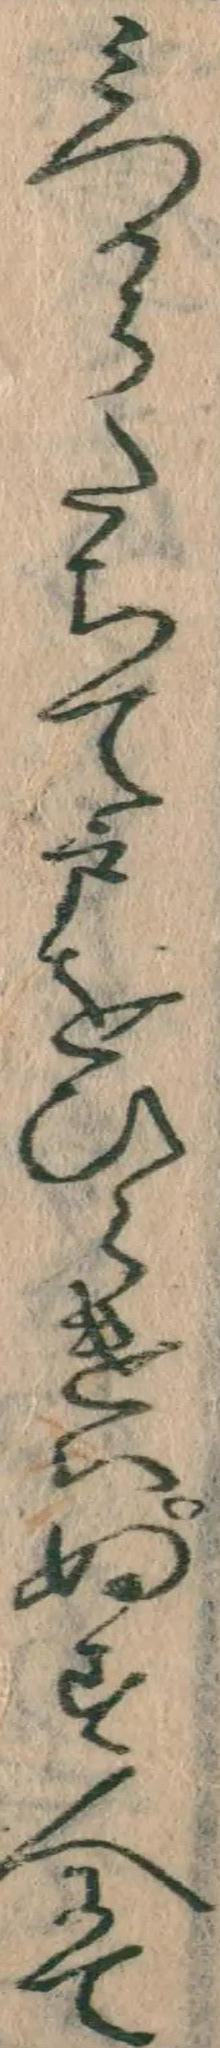みつからたちて戸をひらけは。ぬす人にて
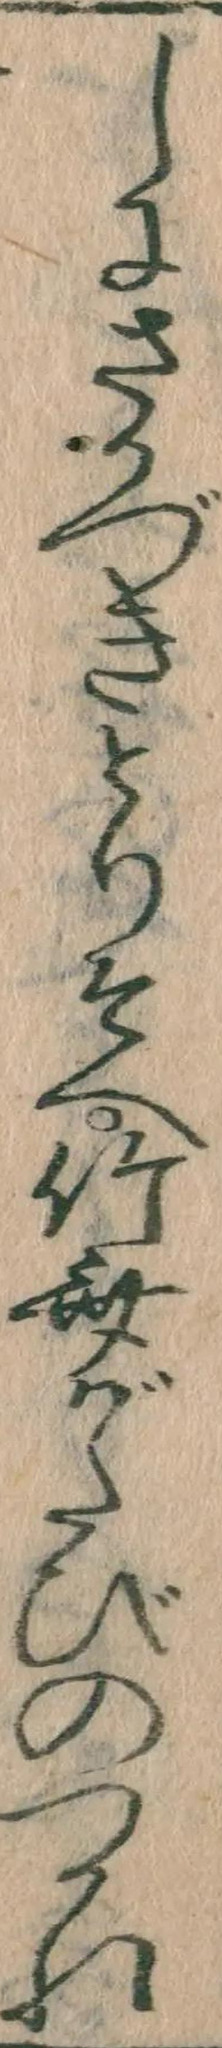しにさかづきとりそへ。竹斎がたびのつかれ
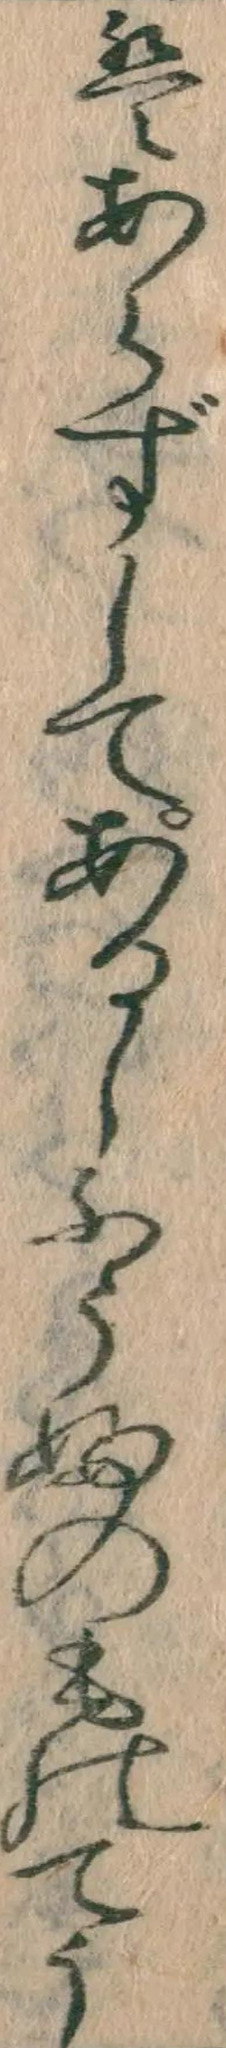はあらずして。あるしふうふのものてう
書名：竹斎狂歌物語 3巻
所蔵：国立国会図書館 National Diet Library, JAPAN
